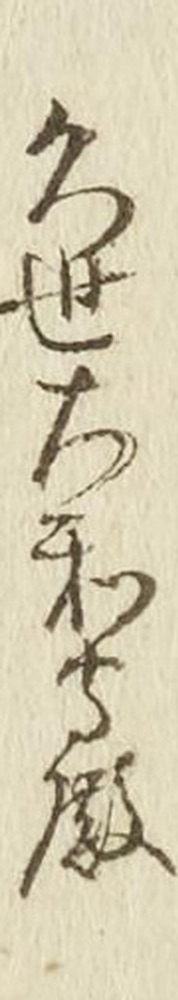久世大和守殿
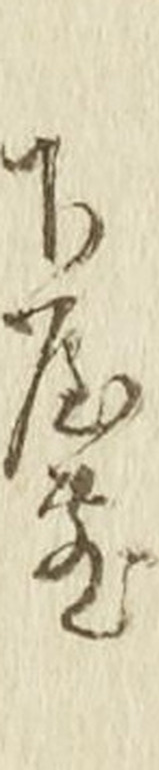下屋敷

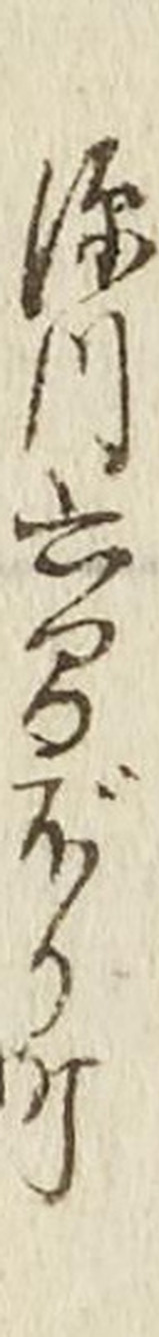深川六間ぼり町
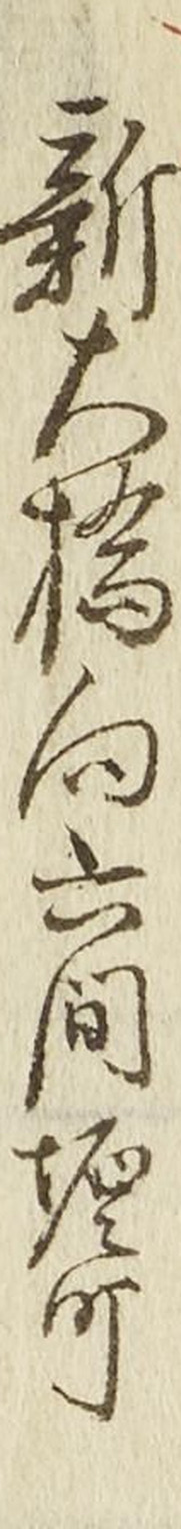新大橋向六間堀町
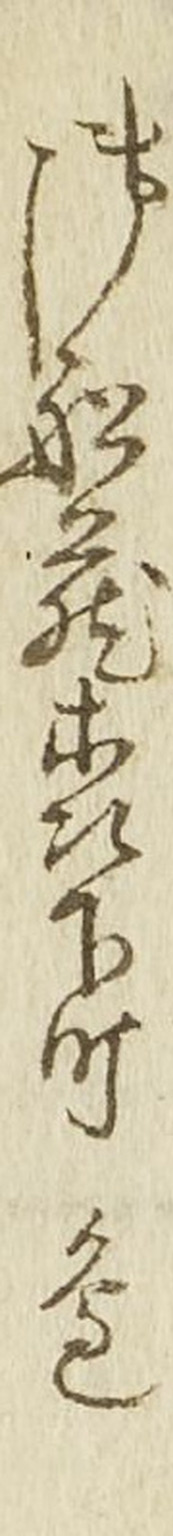御船蔵森下町辺

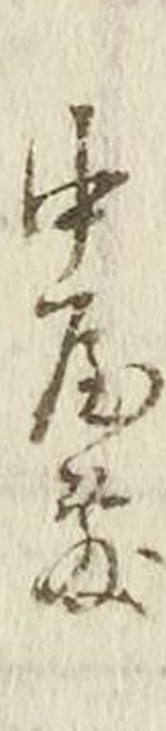中屋敷
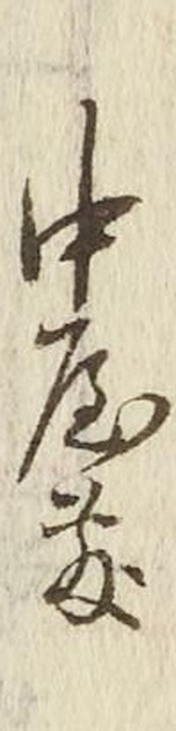中屋敷
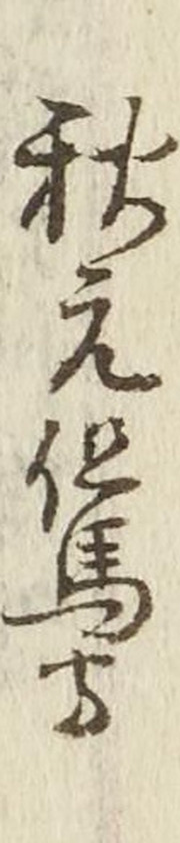秋元但馬守
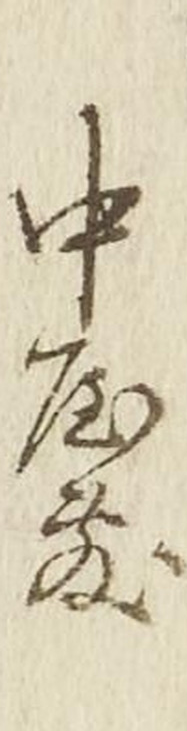中屋敷

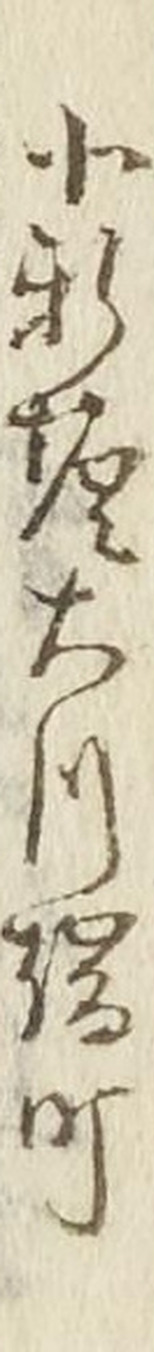北新堀大川端町

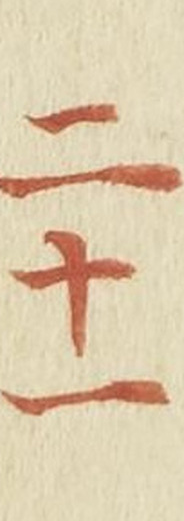二十一
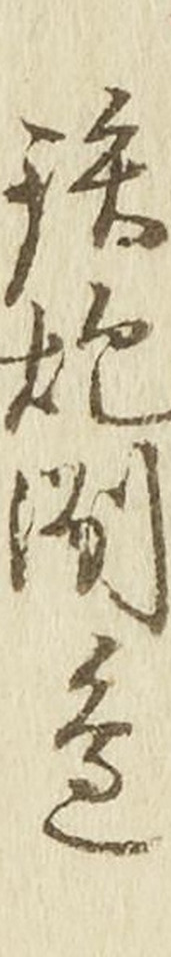鉄炮洲辺

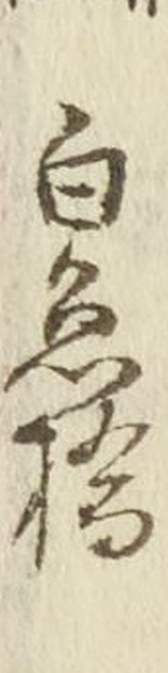白魚橋
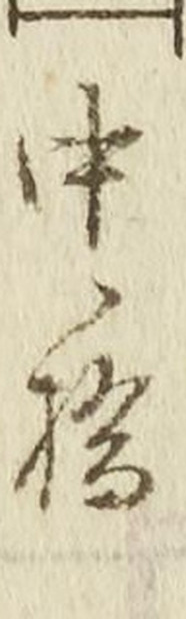中ノ橋
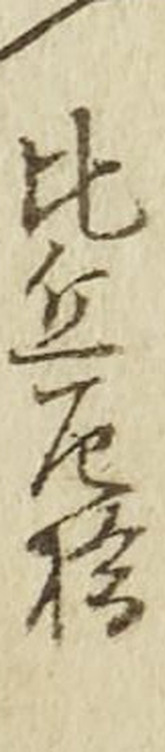比丘尼橋

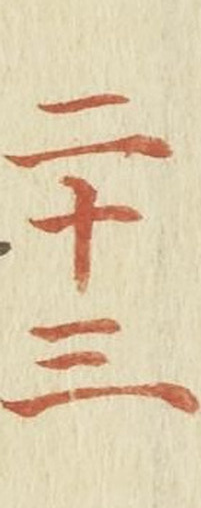二十三
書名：安政二年震災記事　完
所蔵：東京大学地震研究所図書室 Earthquake Research Institute Library, The University of Tokyo, JAPAN
